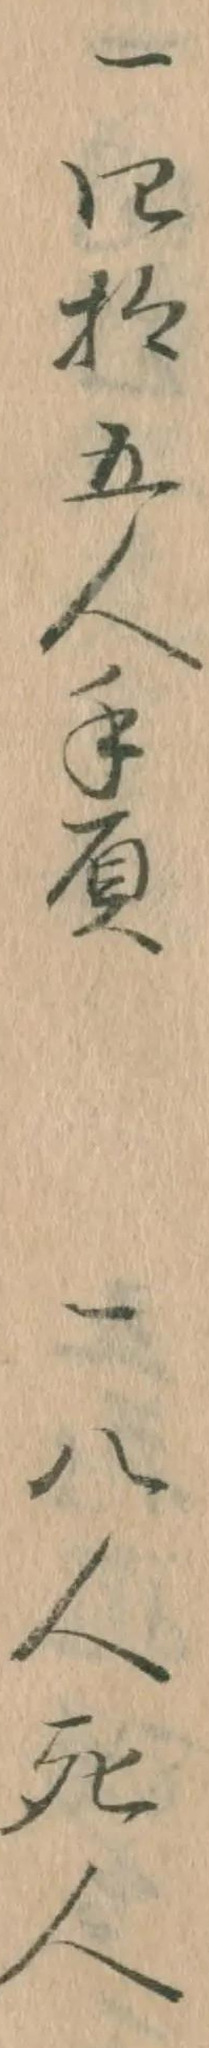一四拾五人手負一八人死人
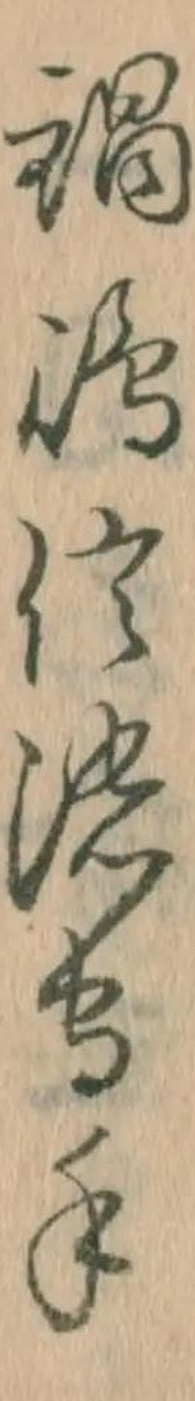鍋島信濃守手
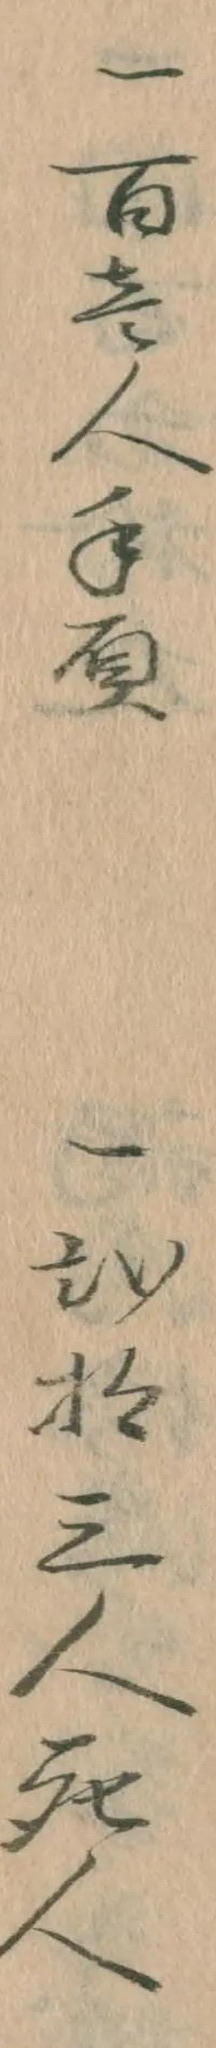一百壱人手負一弐拾三人死人
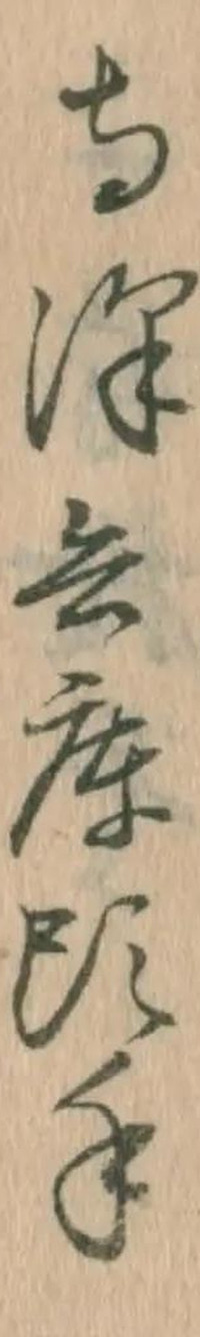寺沢兵庫頭手
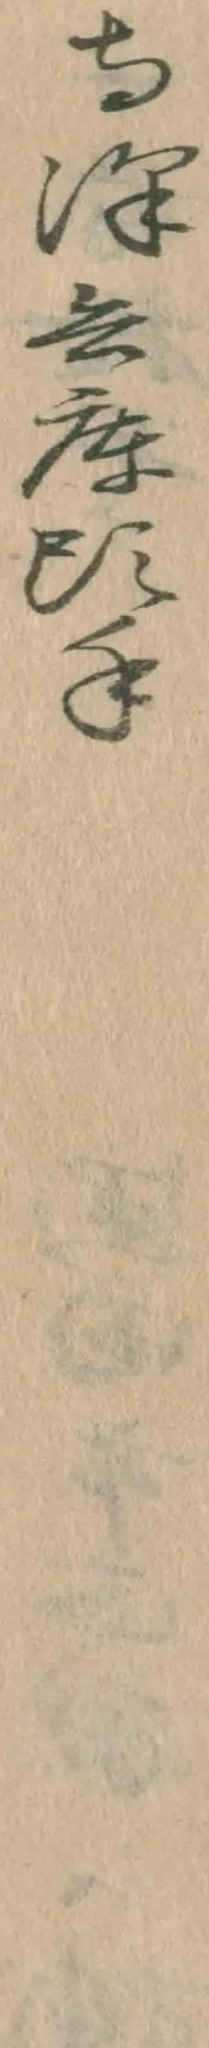寺沢兵庫頭手
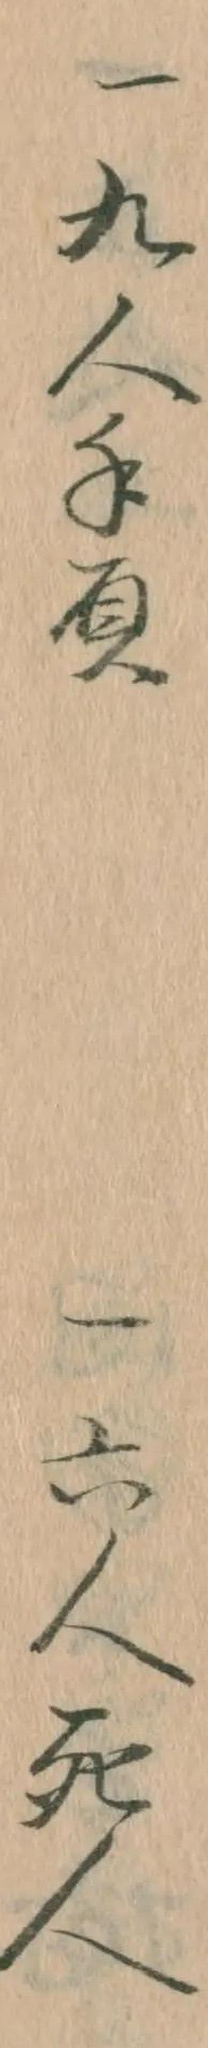一九人手負一六人死人
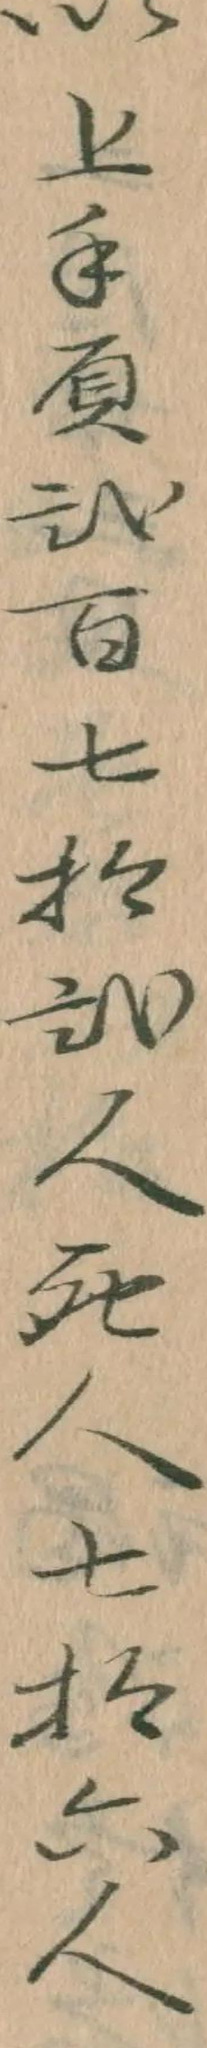以上手負弐百七拾弐人死人七拾六人
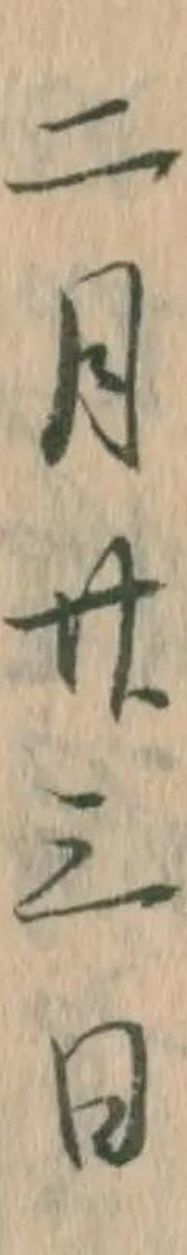二月廿三日
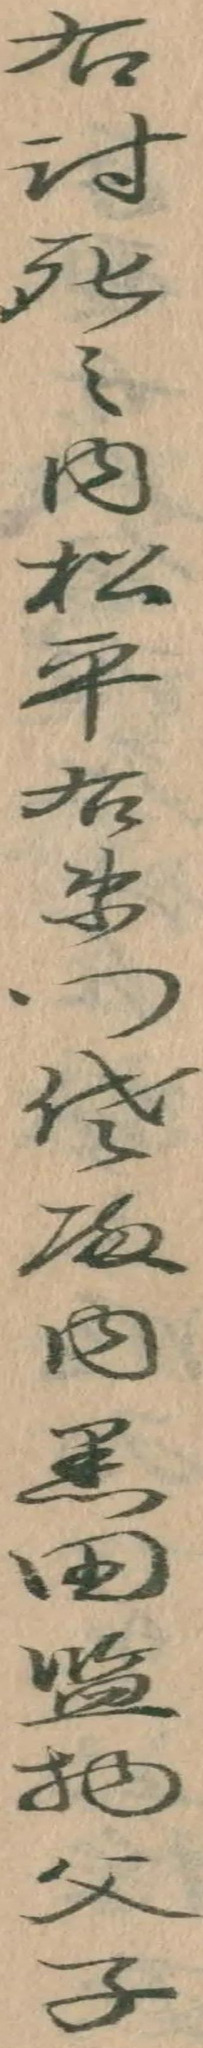右討死之内松平右衛門佐殿内黒田監物父子
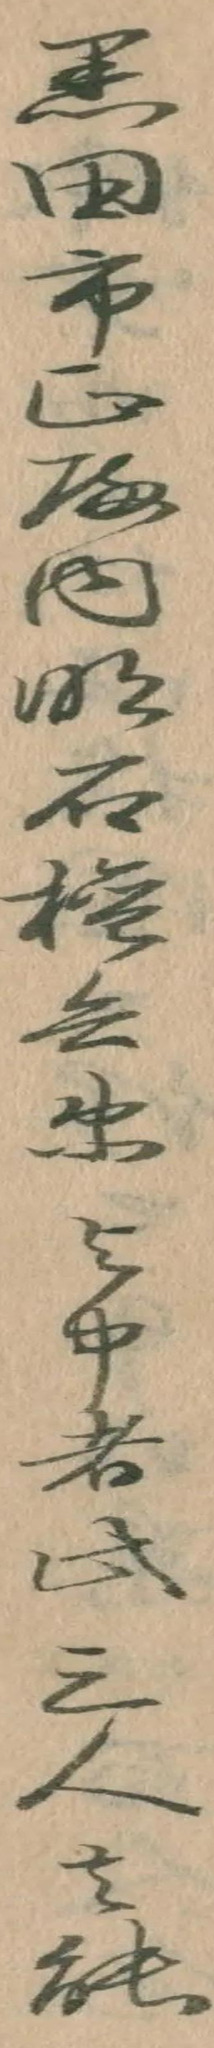黒田市正殿内明石権兵衛与申者此三人者能
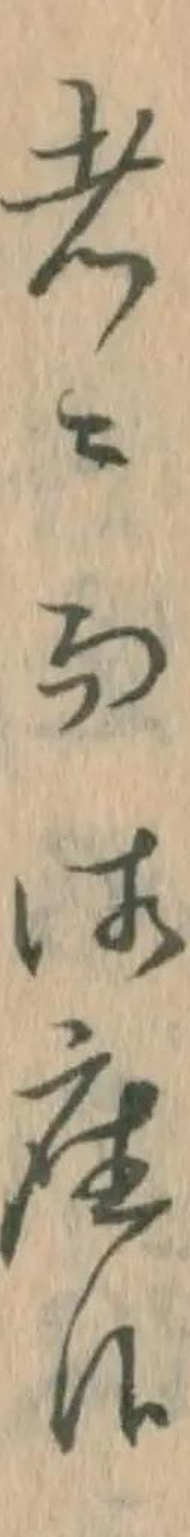者に而御座候
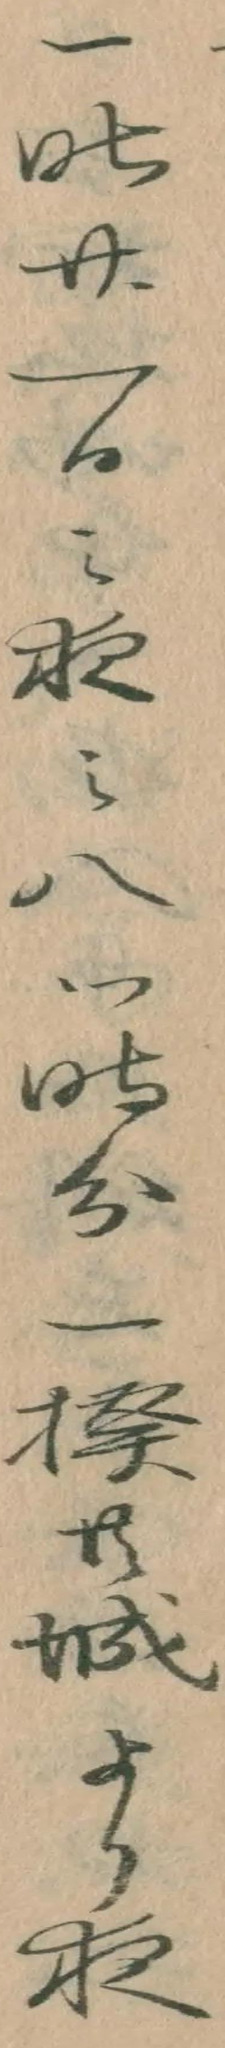一昨廿一日之夜之八つ時分一揆共城より夜
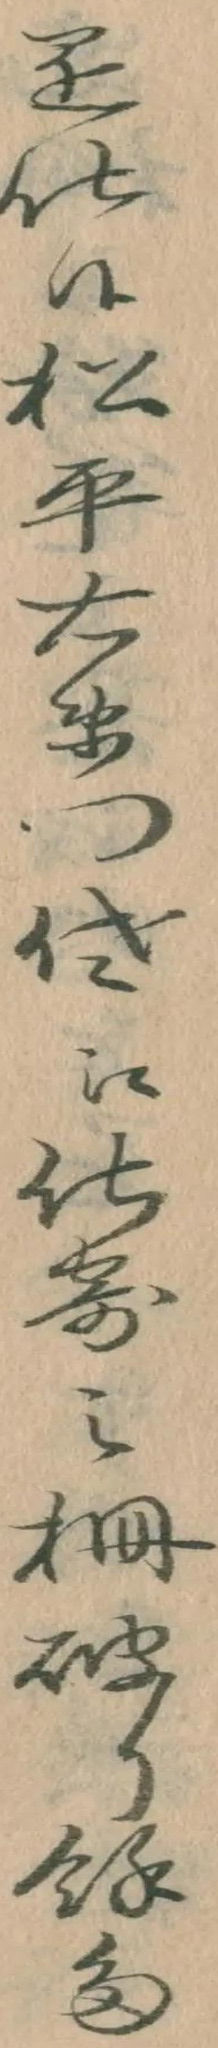懸仕候松平右衛門佐江仕寄之柵破り余多
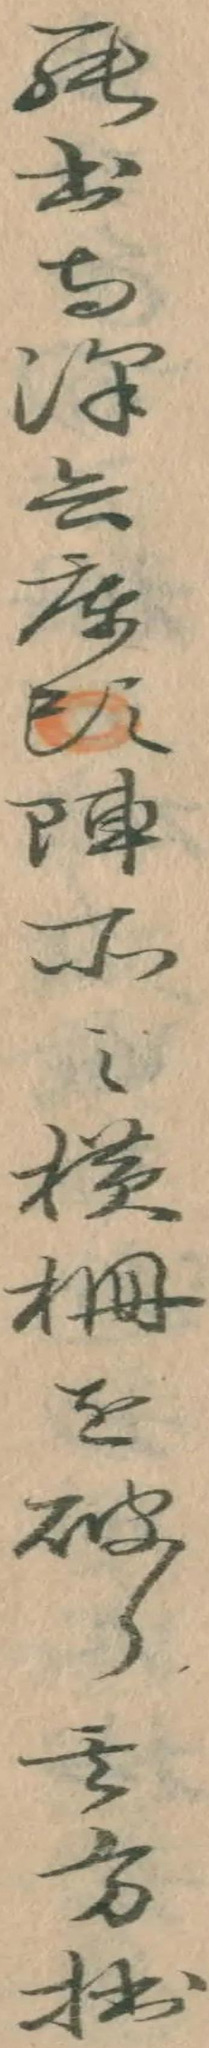罷出寺沢兵庫頭陣所之横柵を破り其方拙
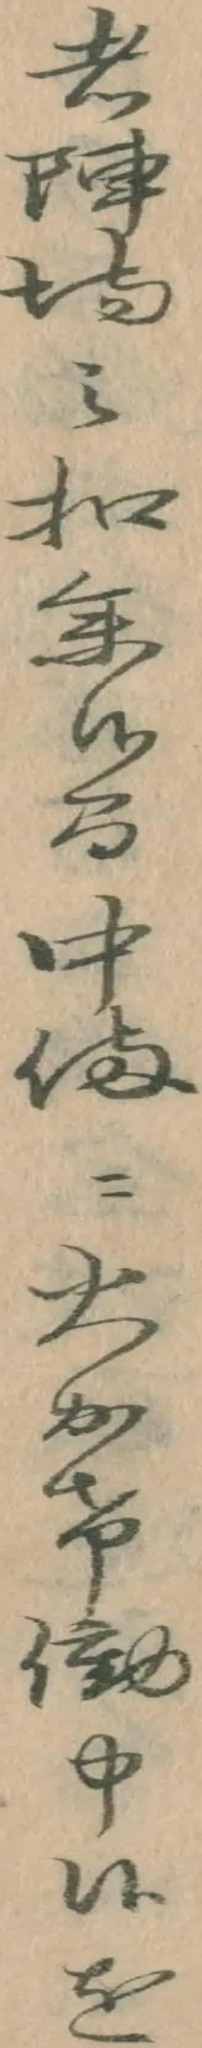者陣場之扣参候間中備に大か希働申候を

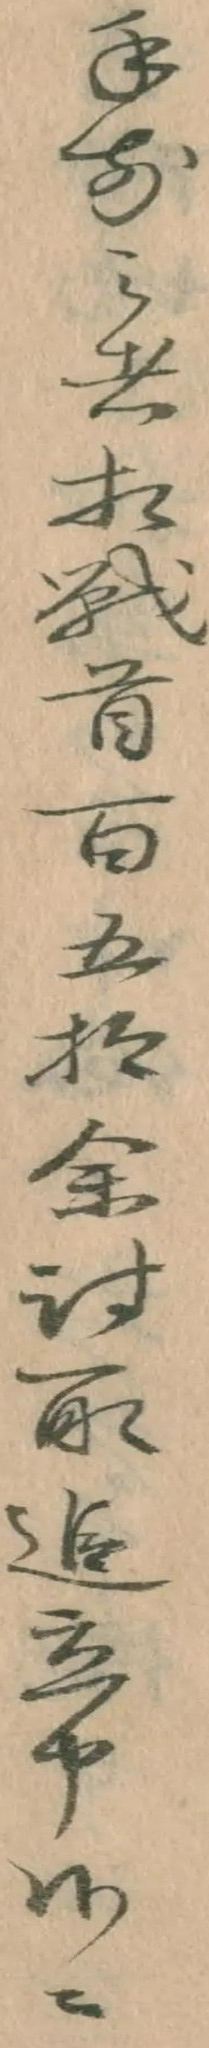手前之者相戦首百五拾余討取迄立申候に
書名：切支丹御退治記 49巻. [7]
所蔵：国立国会図書館 National Diet Library, JAPAN
